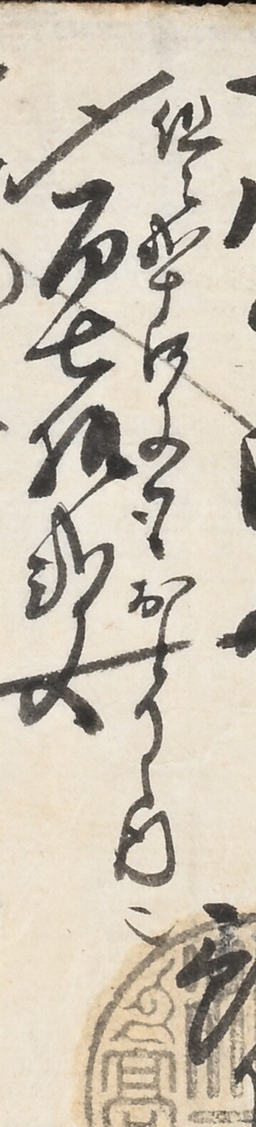〆百七拾弐文
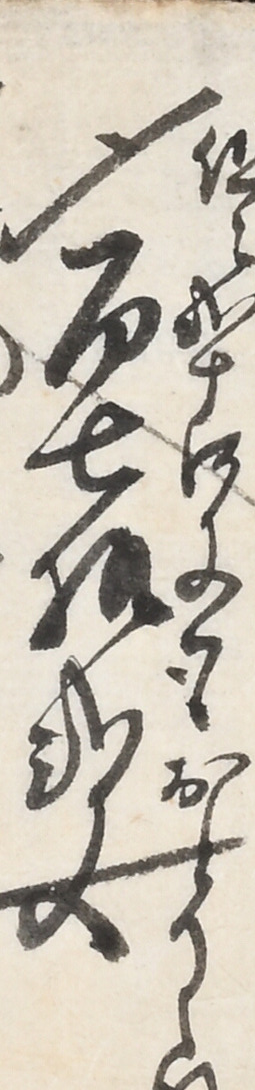〆百七拾弐文
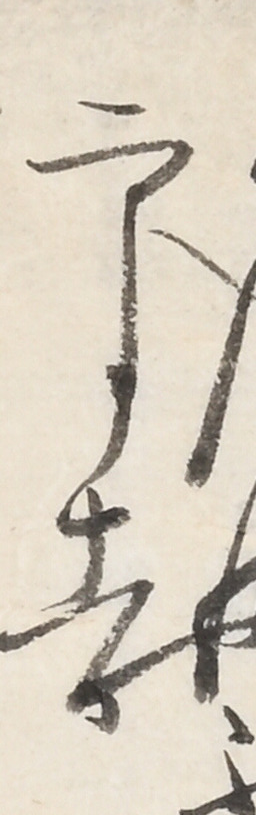二月十一日
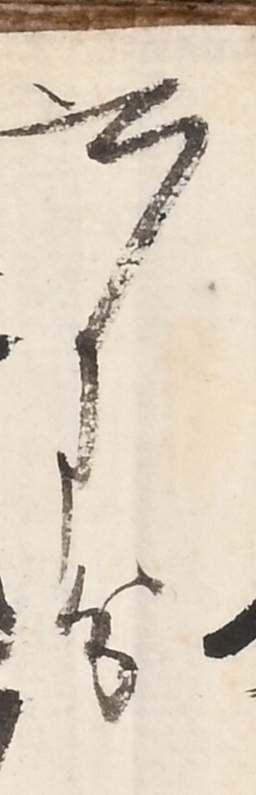正月分

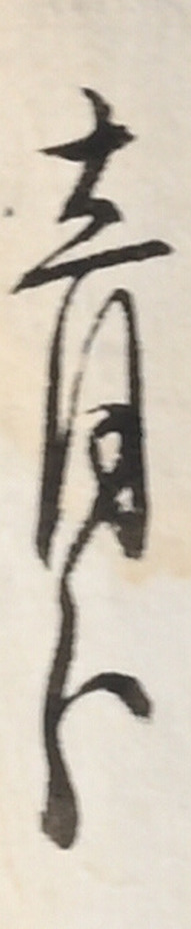十一月分
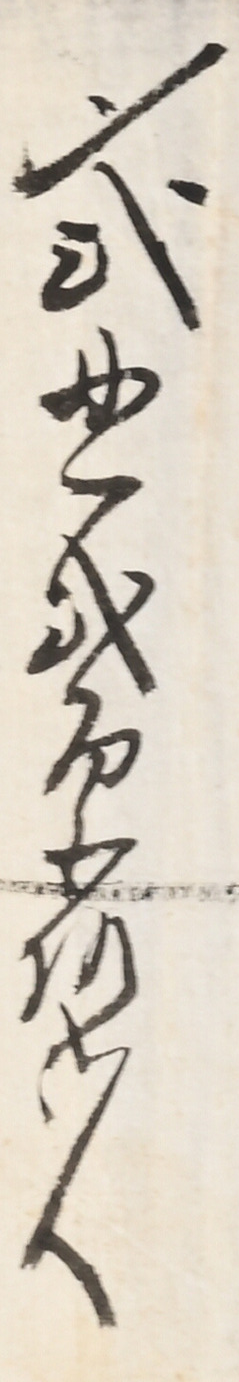〆弐貫弐百五拾弐文
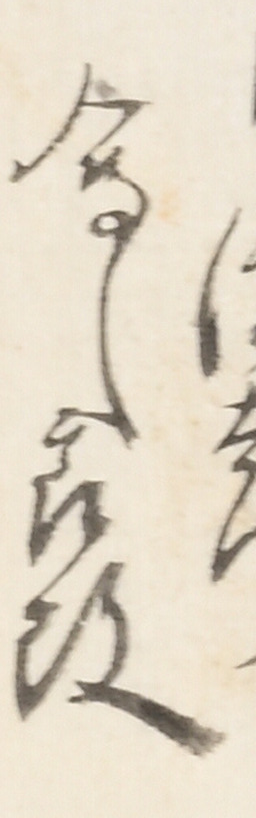会ノ節改
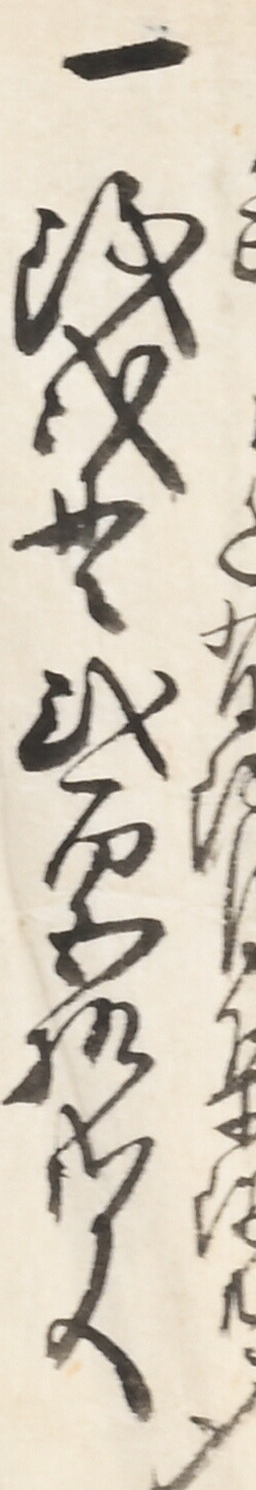一残弐貫弐百五拾弐文
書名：覚
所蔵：伊那市立高遠町図書館・合同会社AMANE
